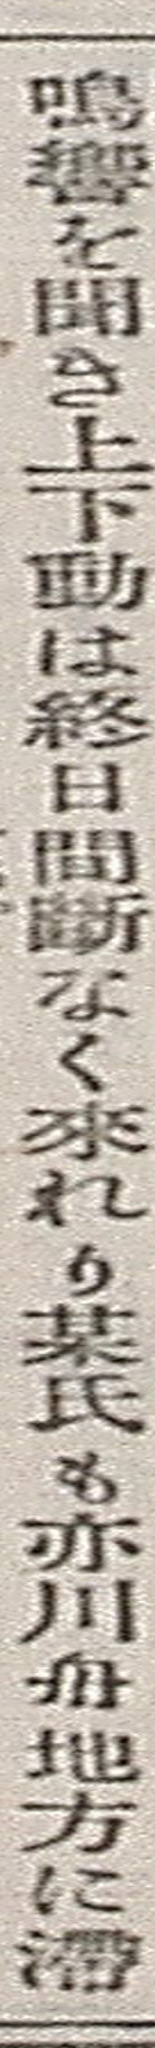鳴響を聞き上下動は終日間断なく来れり某氏も亦川舟地方に滞
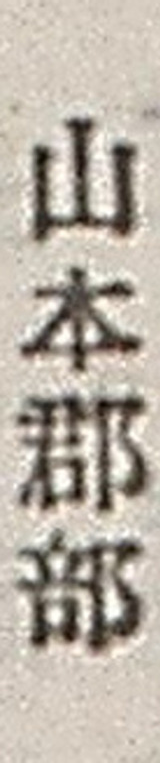山本郡部
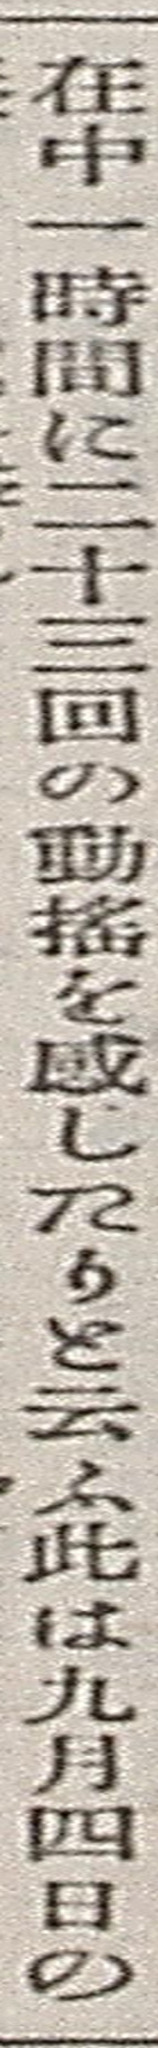在中一時間に二十三回の動揺を感したりと云ふ此は九月四日の
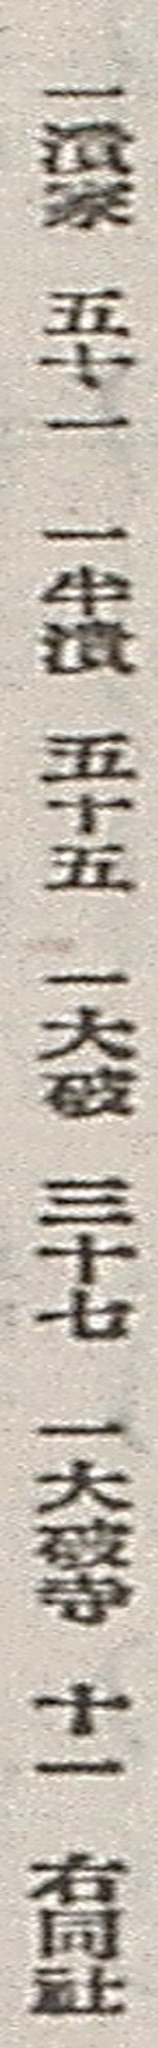一潰家五十一一半潰五十五一大破三十七一大破寺十一右同社
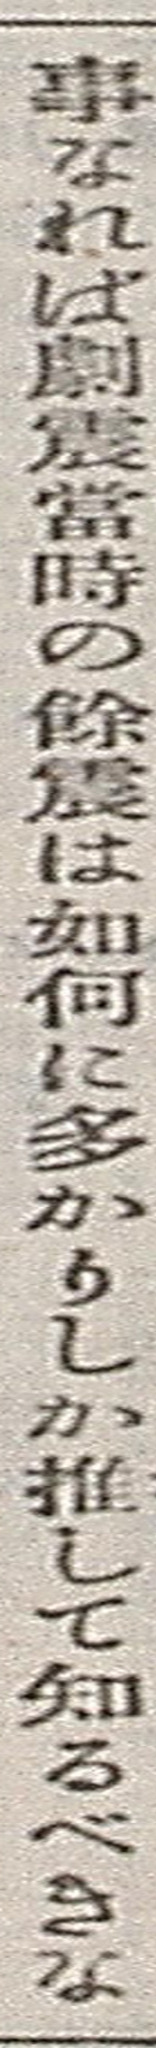事なれば劇震当時の余震は如何に多かりしか推して知るべきな
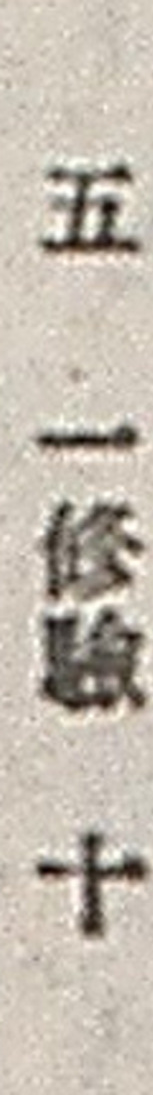五一修験十
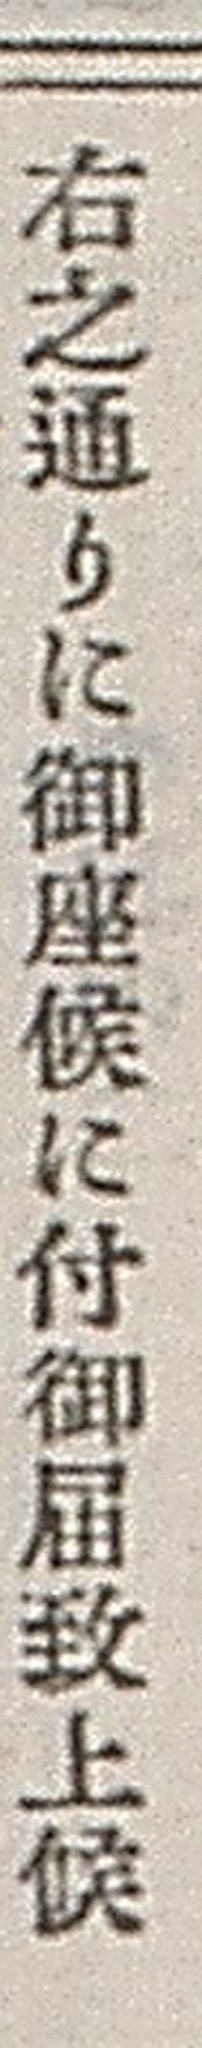右之通りに御座候に付御届致上候
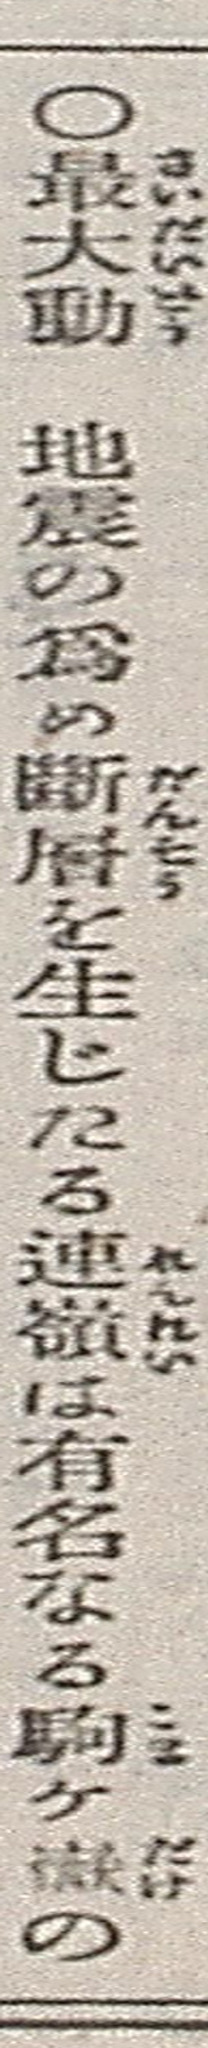〇最大動地震の為め断層を生じたる連嶺は有名なる駒ヶ嶽の
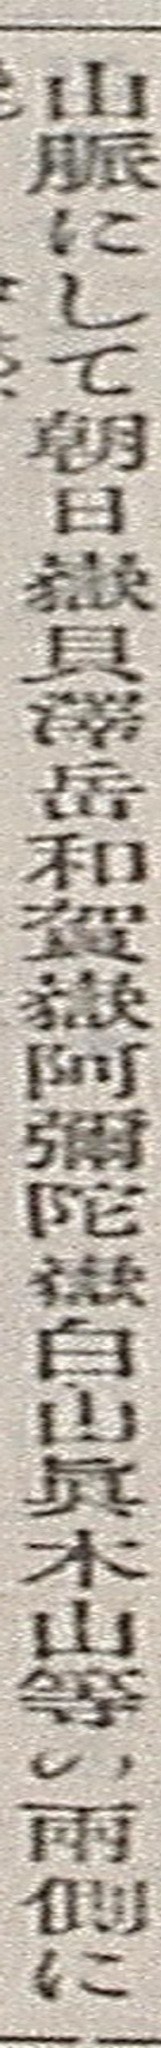山脈にして朝日嶽貝沢岳和賀嶽阿弥陀嶽白山真木山等の両側に
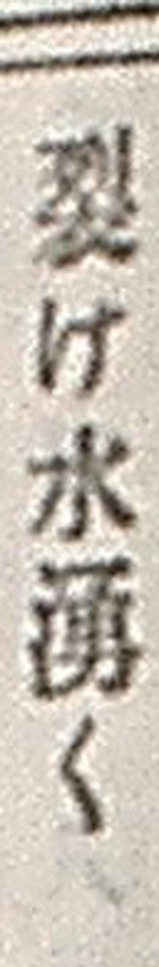裂け水湧く
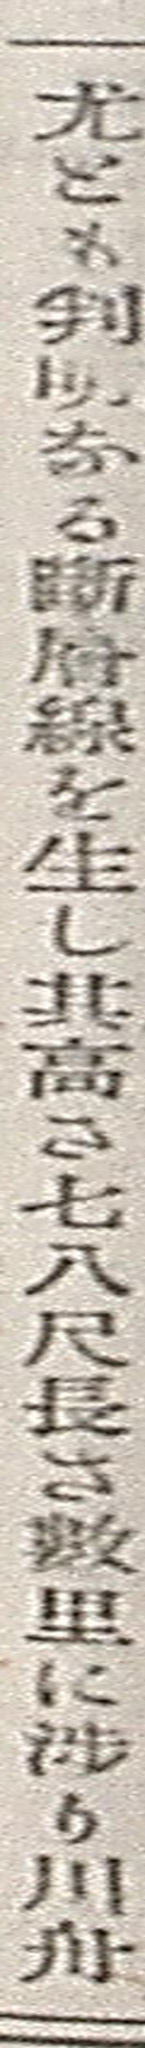尤とも判明なる断層線を生し其高さ七八尺長さ数里に渉り川舟
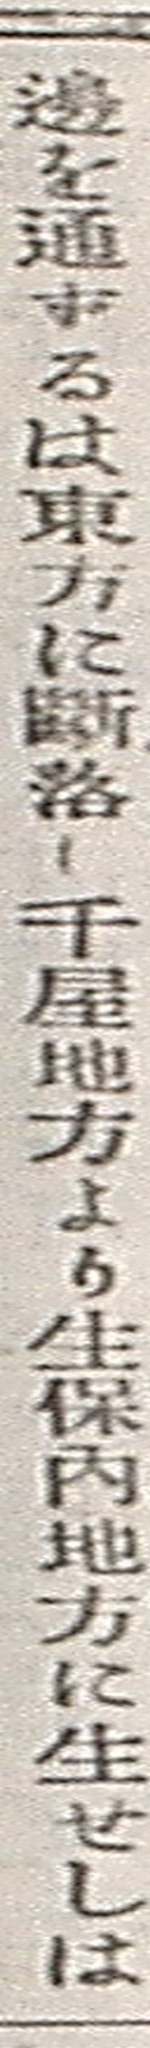辺を通ずる東方は断落し千屋地方より生保内地方に生せしは
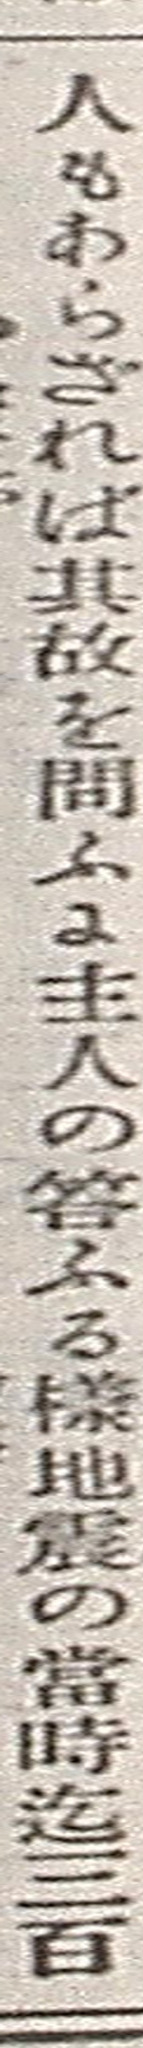人もあらざれば其故を問ふに主人の答ふる様地震の当時迄三百
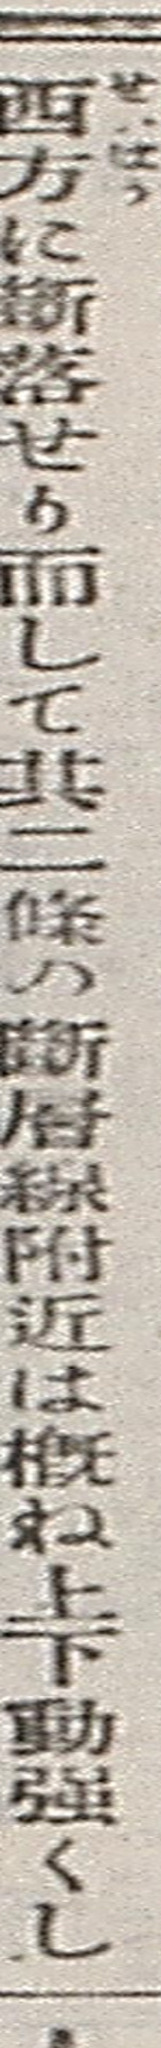西方に断落せり而して其二条の断層線附近は概ね上下動強くし
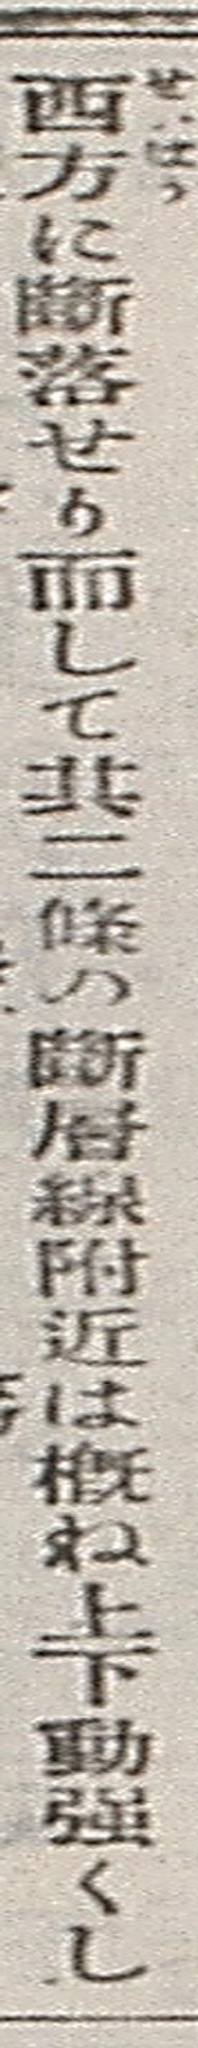西方に断落せり而して其二条の断層線附近は概ね上下動強くし
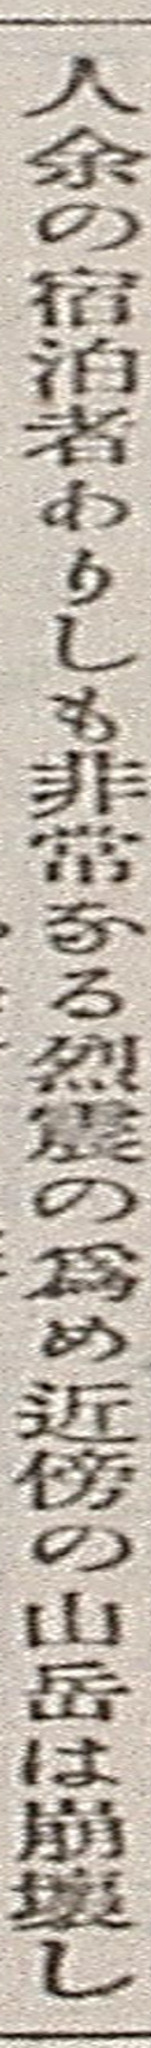人余の宿泊者ありしも非常なる烈震の為め近傍の山岳は崩壊し
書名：風俗畫報臨時増刊第百二十四號　洪水地震被害録（上）
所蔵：東京大学地震研究所図書室 Earthquake Research Institute Library, The University of Tokyo, JAPAN
